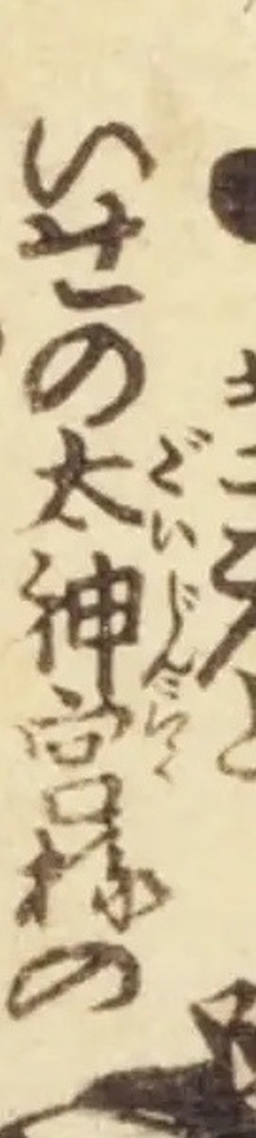いせの太神宮様の
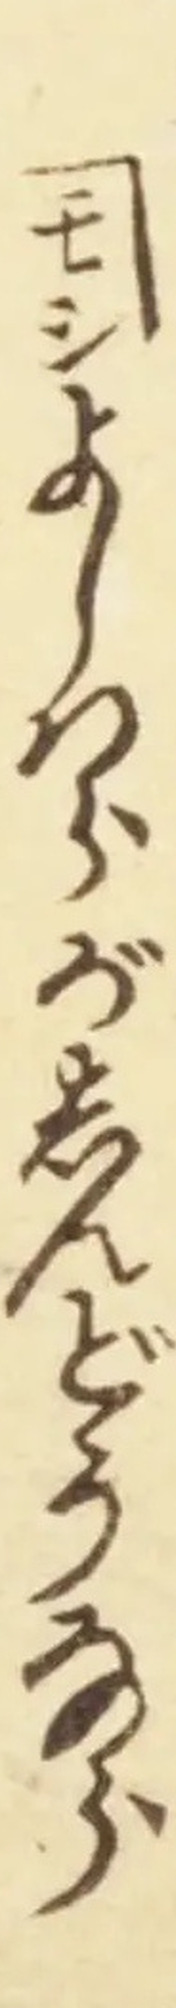〽モシよしわらがしんどうなら
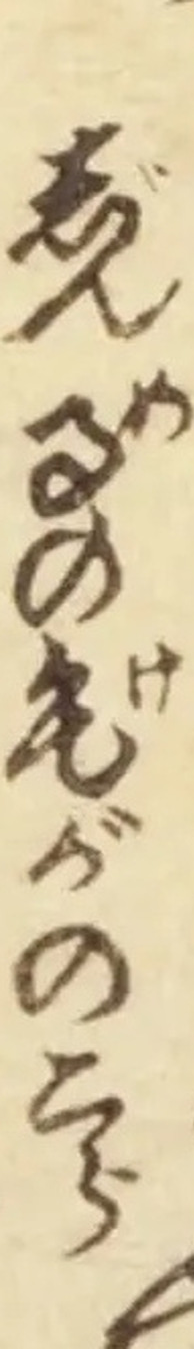しん馬の毛がのくら
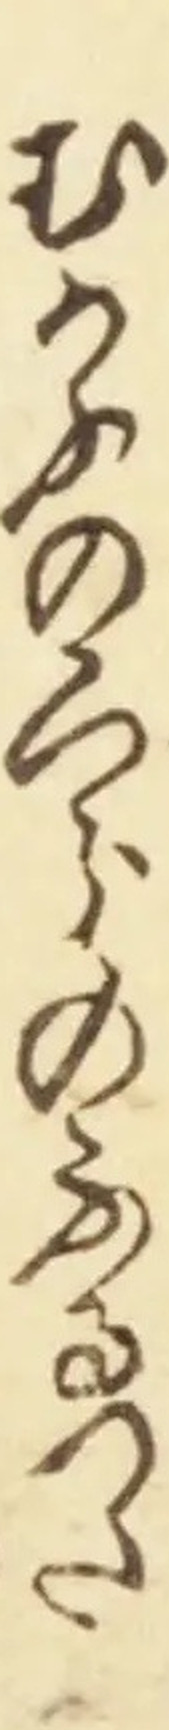むかふのくらのふるつた
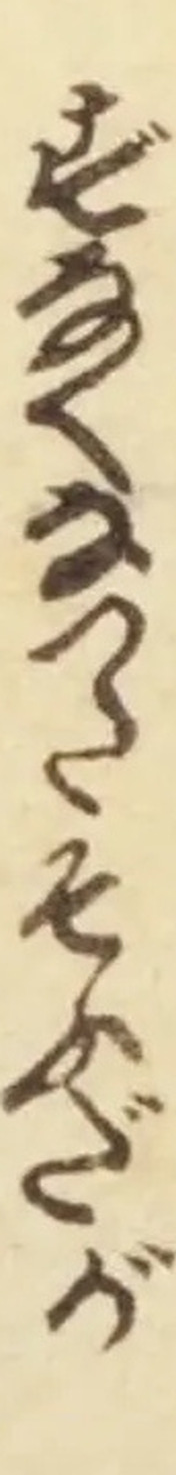ずなくなつたそふだが
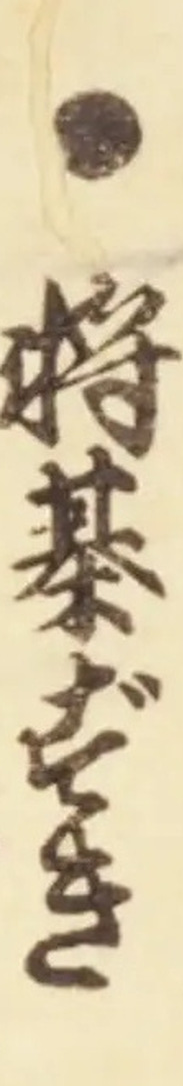●将棋ずき
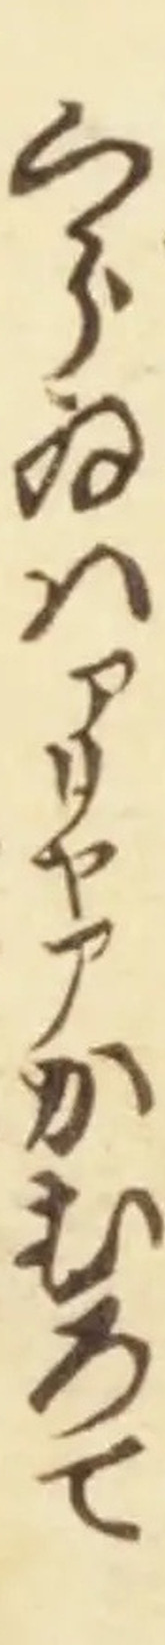くらゐはアリヤアかむろて
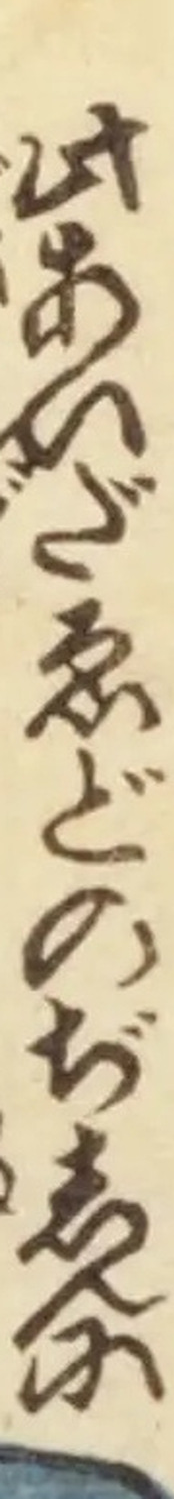此あいだゑどのぢしんに
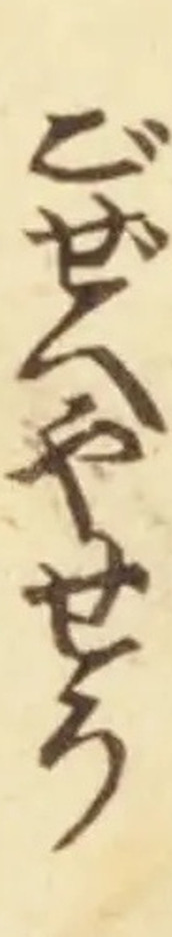ごぜへやせう
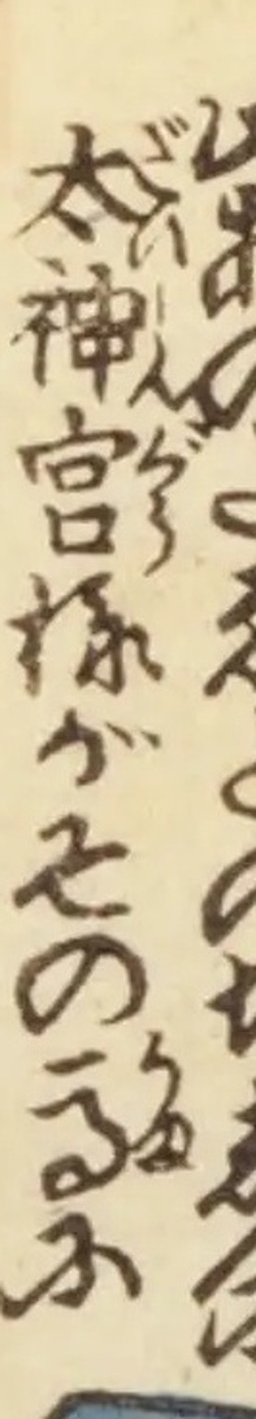太神宮様がその馬に
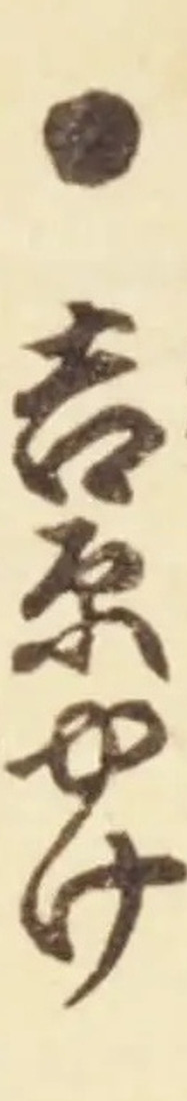●吉原やけ
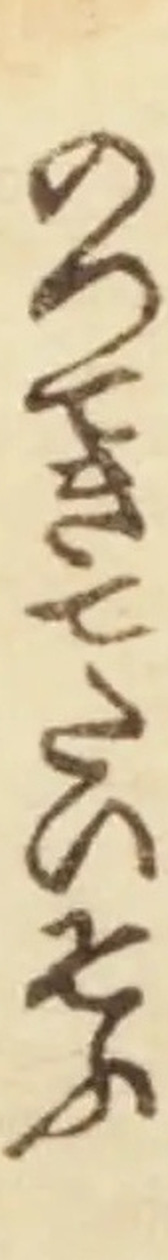のつてきてたいそふ
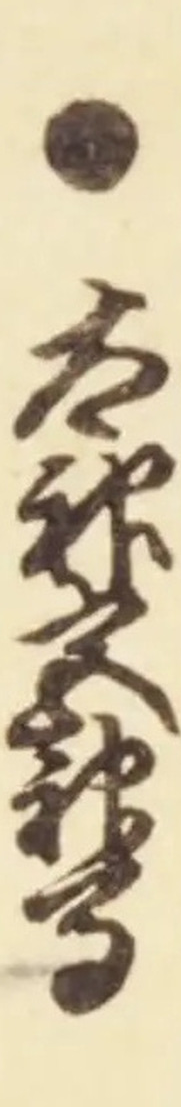●太神宮神馬
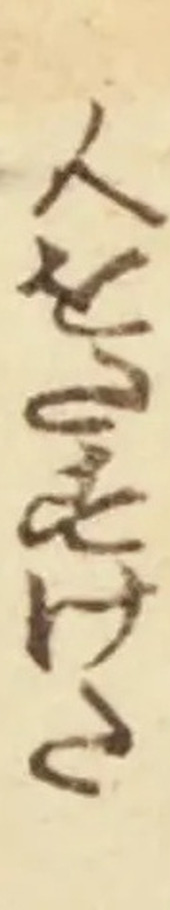人をたすけた
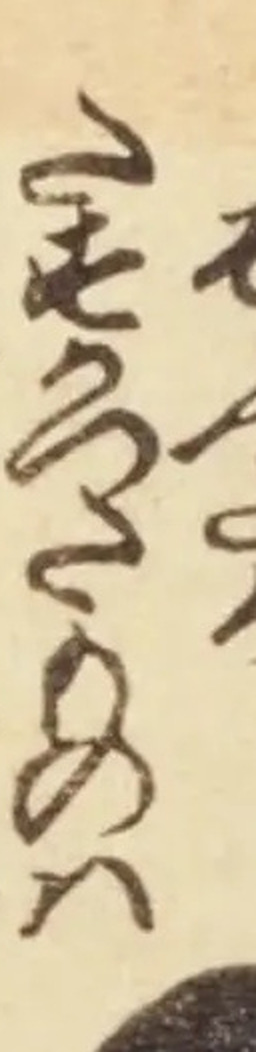たすかつたものは
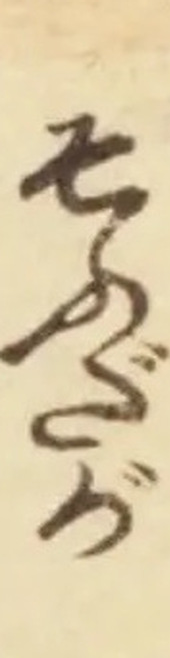そうだが
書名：二日はなし地震亭念魚町々庵炎上
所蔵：国立国会図書館 National Diet Library, JAPAN
